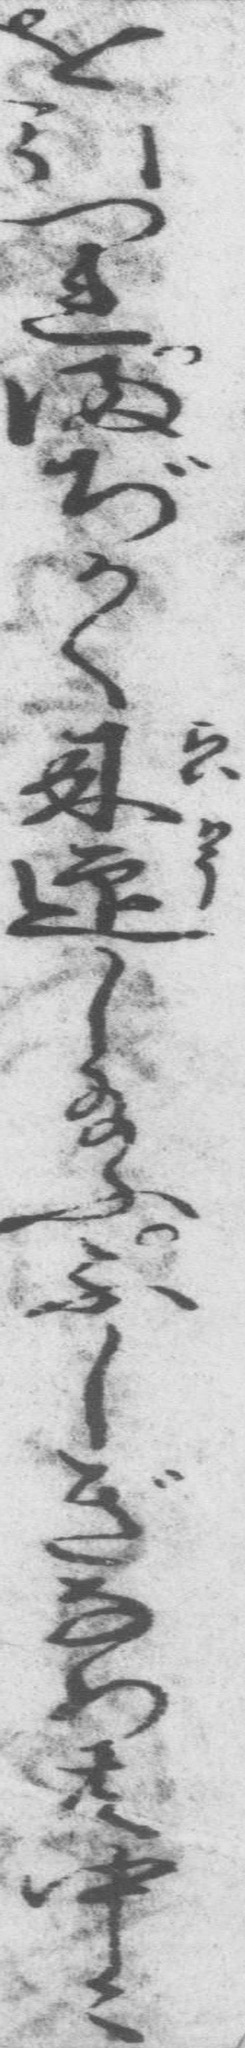を引つれ。まぢかく来迎し給ふ。ふしぎなり共中々
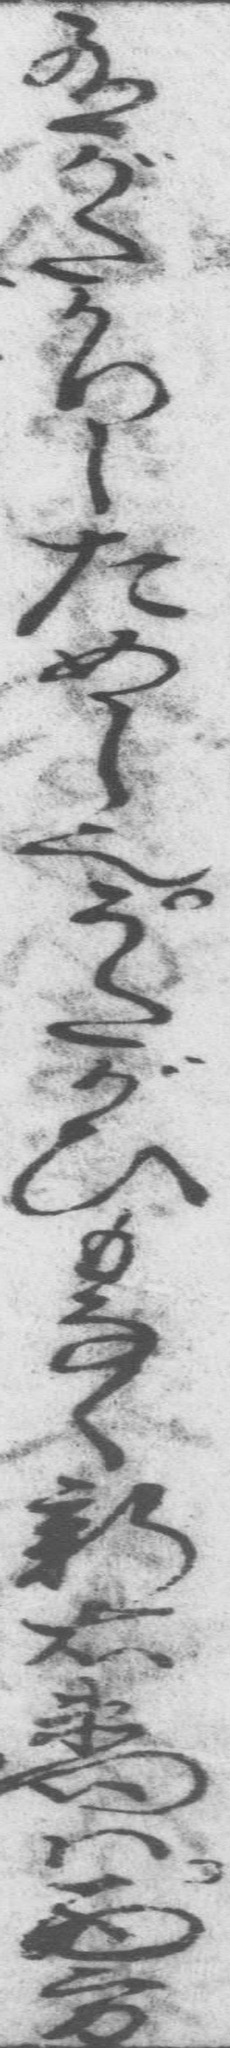有がたかりしためし也。うたがひもなく新右衛門は西方
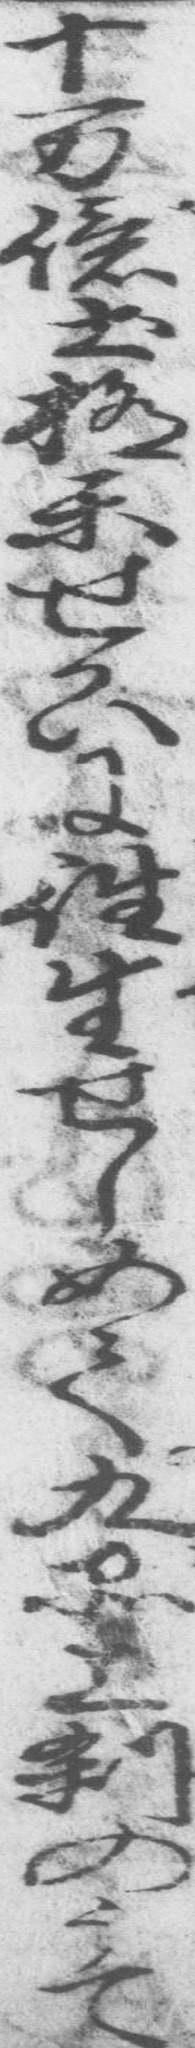十万億土極楽せかいに往生せしめて。九品上刹のうて
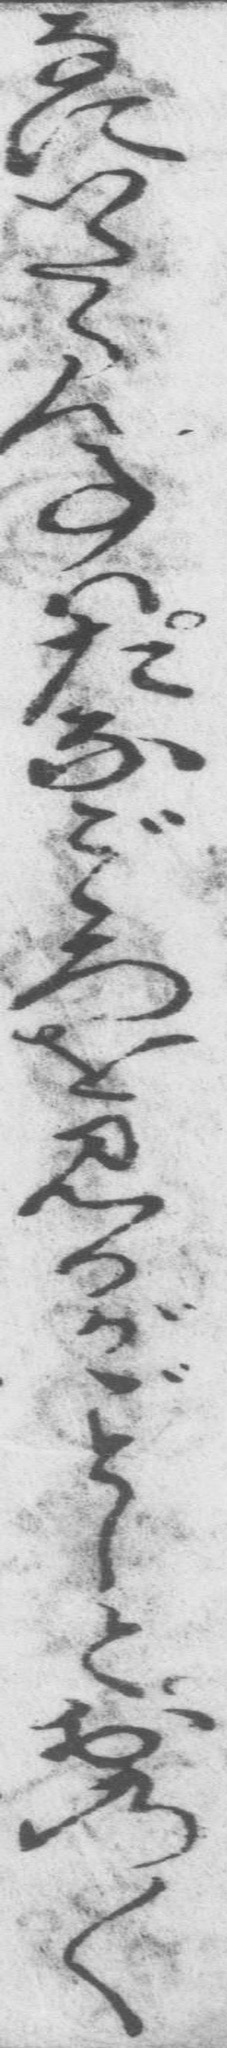なにいたらん事は。たなごゝろを見るがごとしと。おの〳〵
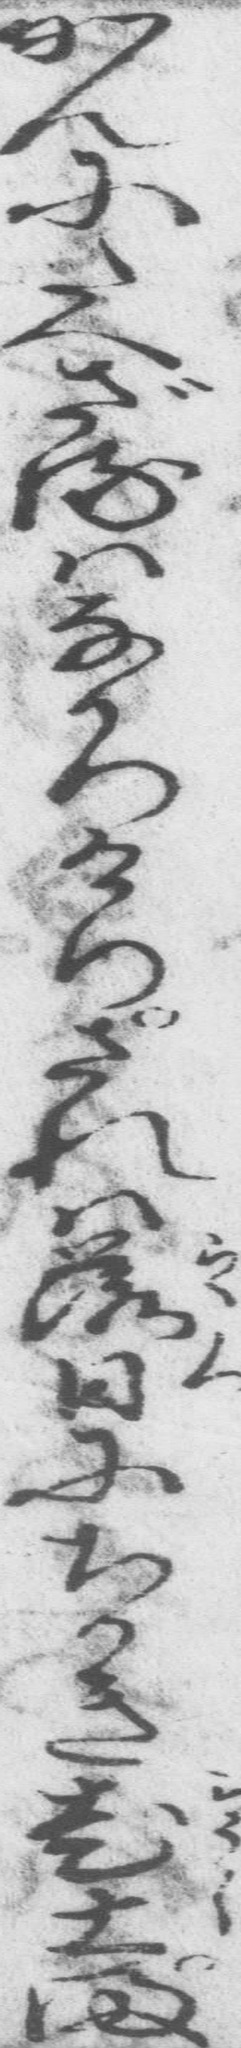かんにたへざるはなかりけり。されは落日にちかき老士。ま
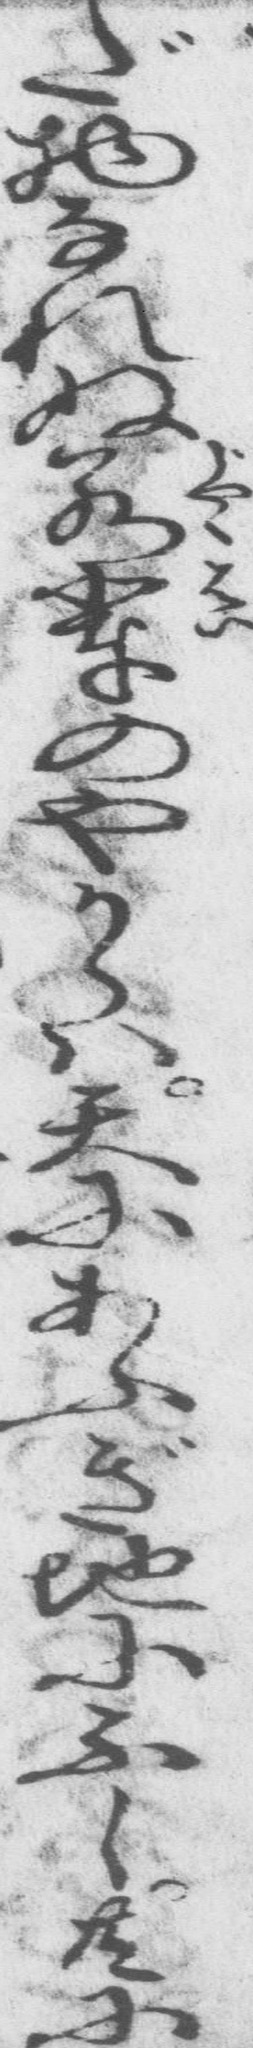だ物なれぬ若輩のやからは。天にあふぎ地にふし。共に
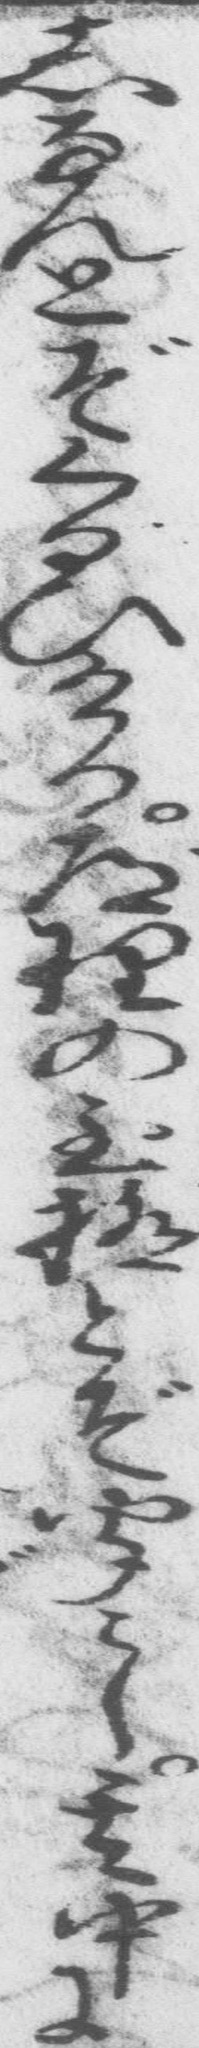しなんとぞくるひける。道理の至極とぞ聞こし。其中に
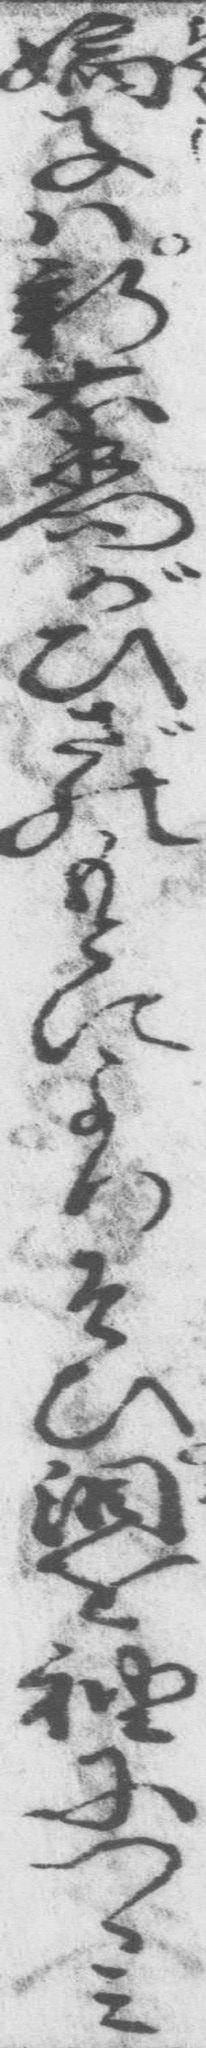嫡子は。新右衛門がひざのもとによりそひ。泪を袖につゝみ
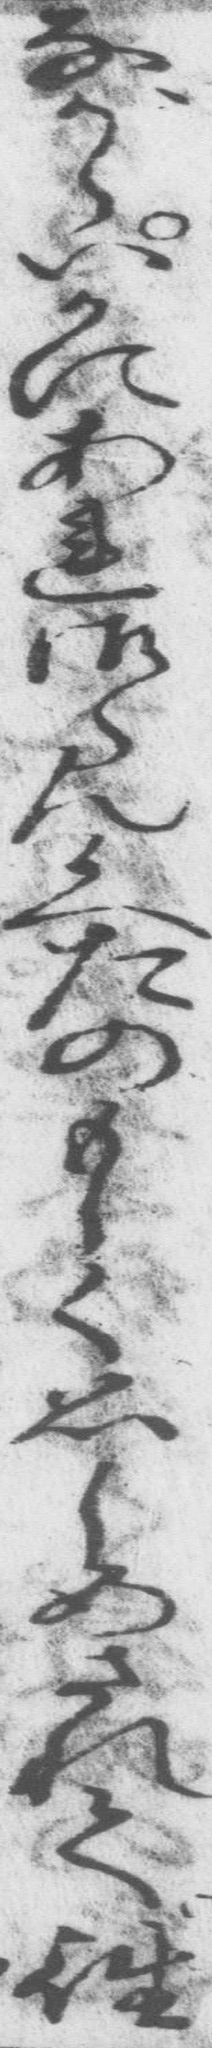ながら。いかにあれ御らん候へ。たのもしく思しめされて。往
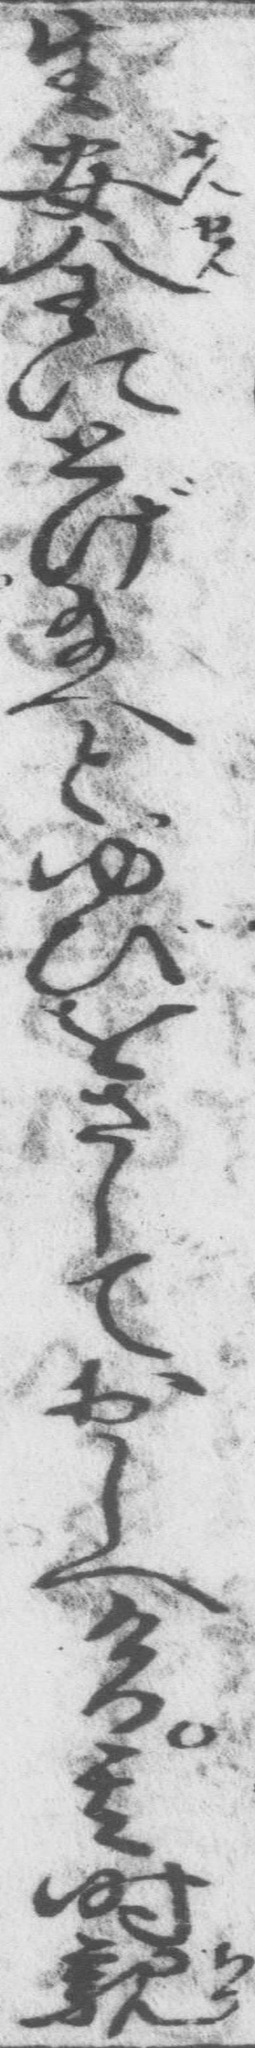生安全にとげ給へと。ゆびをさしておしへける。其時親
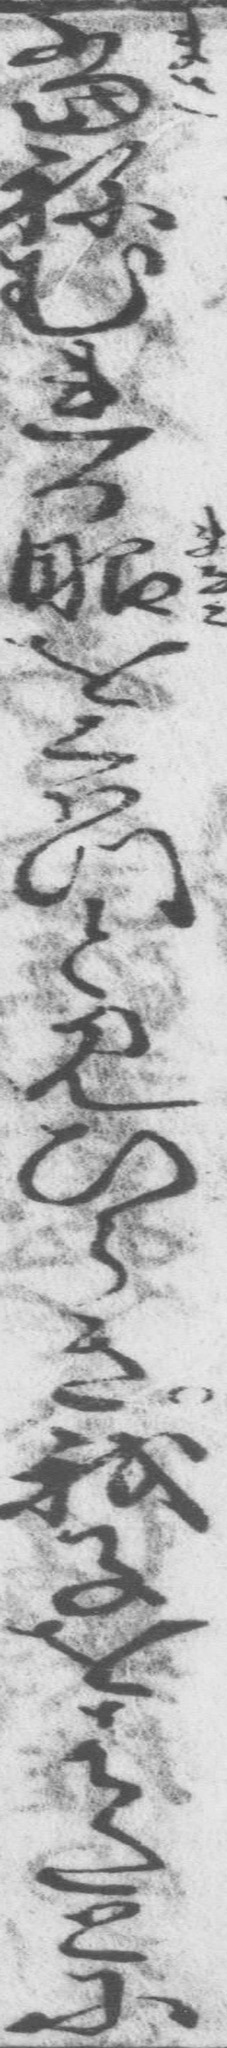当ねむれる眼をくはつと見ひらき。我子をはたとに
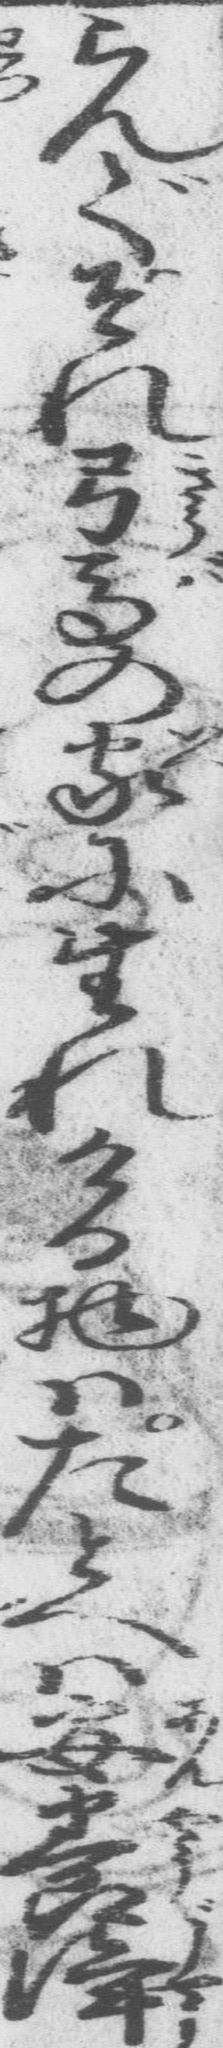らんで。それ弓馬の家に生れける物は。たとへは安養浄
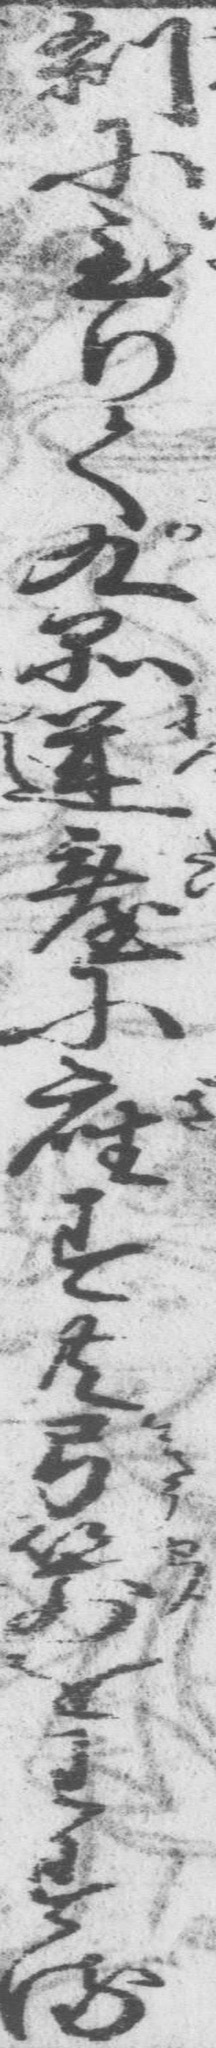刹に至りて。九品蓮台に座す共。弓箭をわする
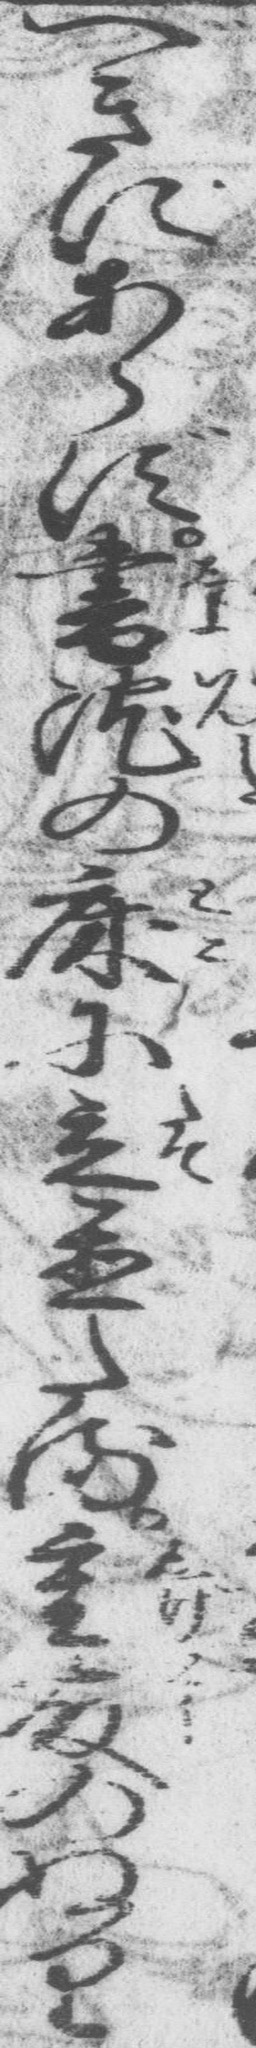へきにあらず。書院の床に立置たる。重藤のぬり
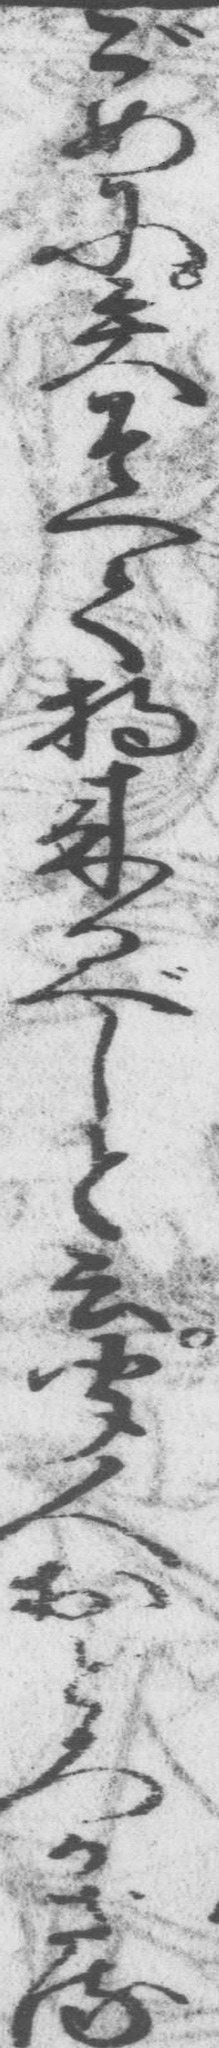ごめに。矢そへて持来るべしと云。聞人おとろかざる
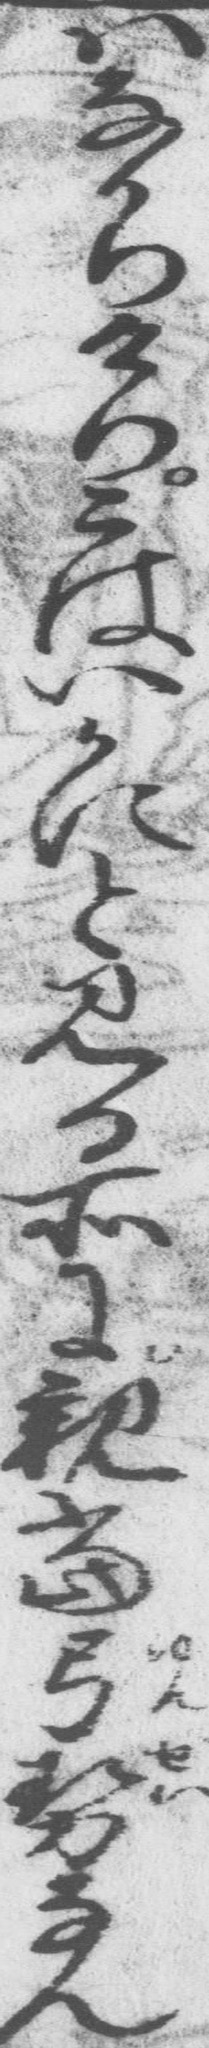はなかりけり。こはいかにと見る所に親当弓勢なん
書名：一休はなし（元禄十三）
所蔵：大阪公立大学中百舌鳥図書館 国文学研究資料館
